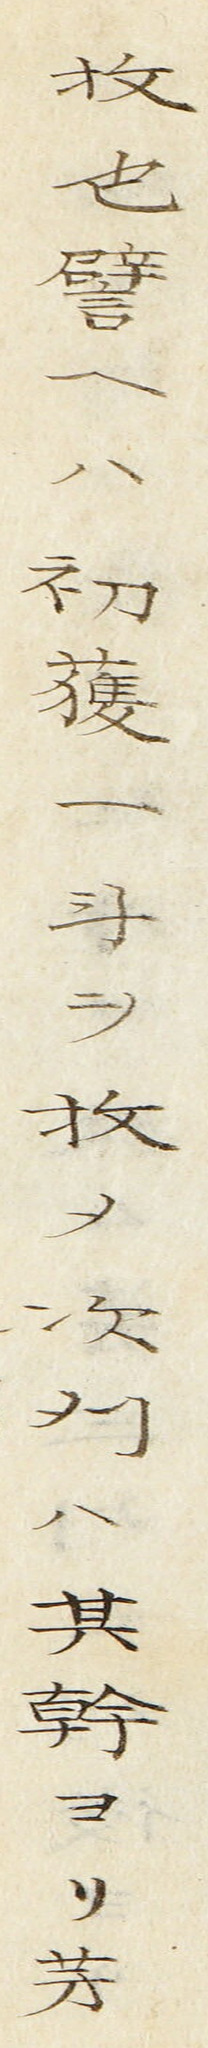枚也譬ヘハ初か獲一斗ヲ収シテ次刈ハ其幹ヨリ芽

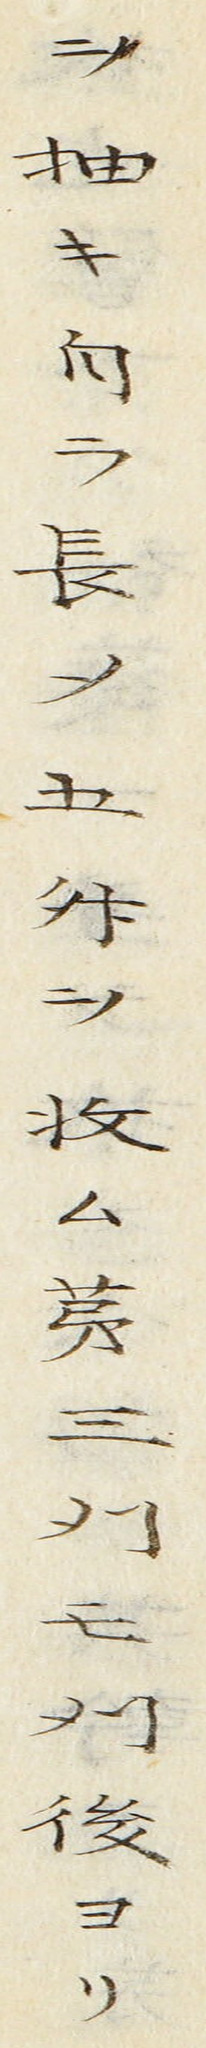ヲ抽キ自ラ長シテ五升ヲ収ム第三刈モ刈後ヨリ
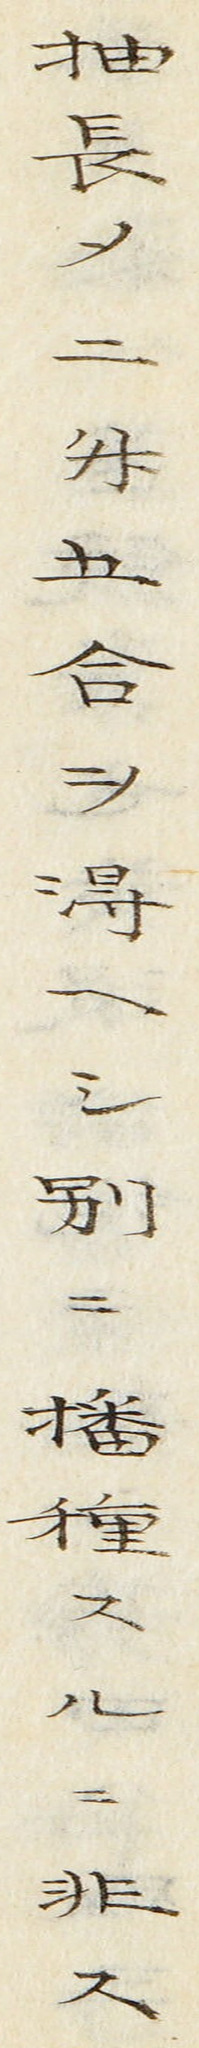抽長シテニ升五合ヲ得ヘシ別ニ播種スルニ非ス
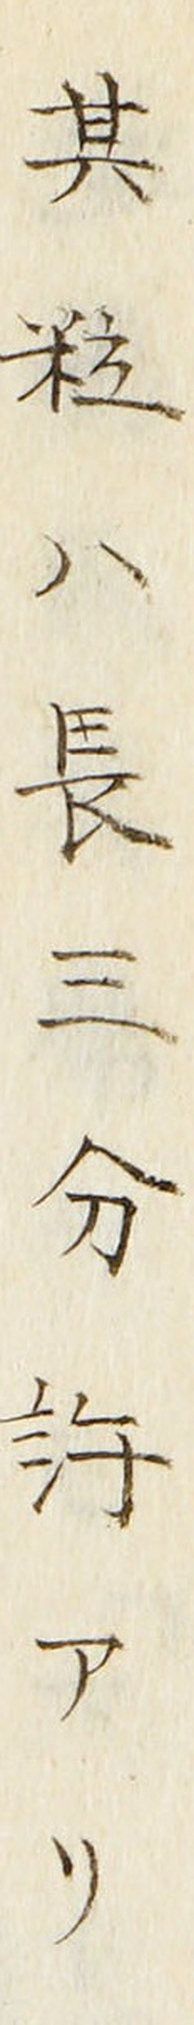其粒ハ長三分許アリ
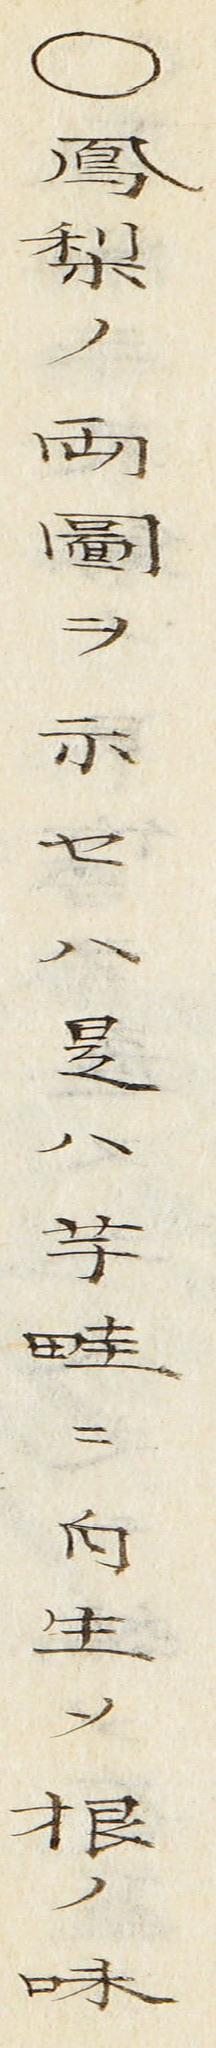〇鳳梨ノ両図ヲ示セハ是ハ芋畦ニ自生シテ根ノ味
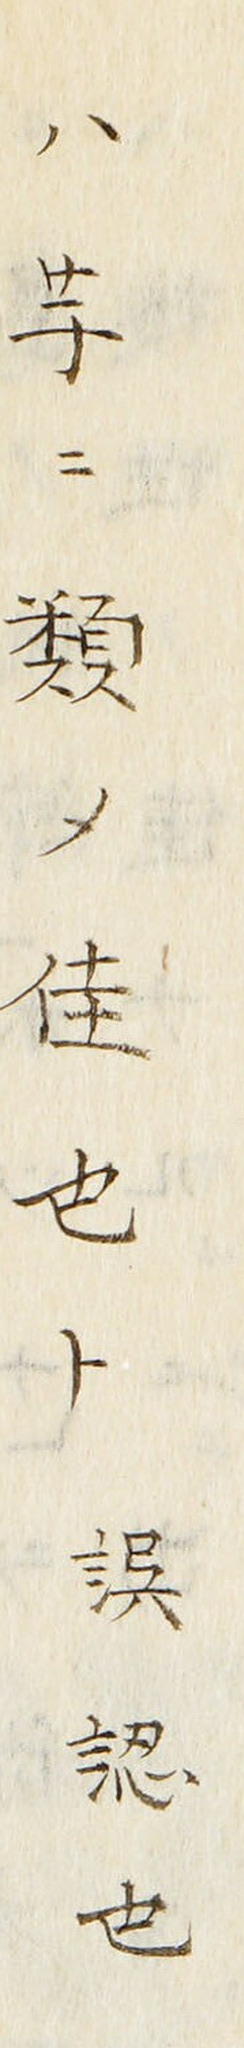ハ芋ニ類シテ佳也ト誤認也
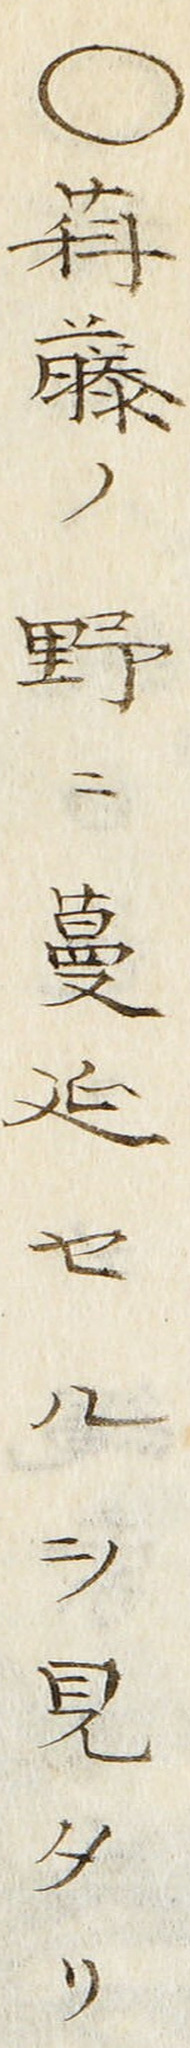〇萪藤ノ野ニ蔓延セルヲ見タリ
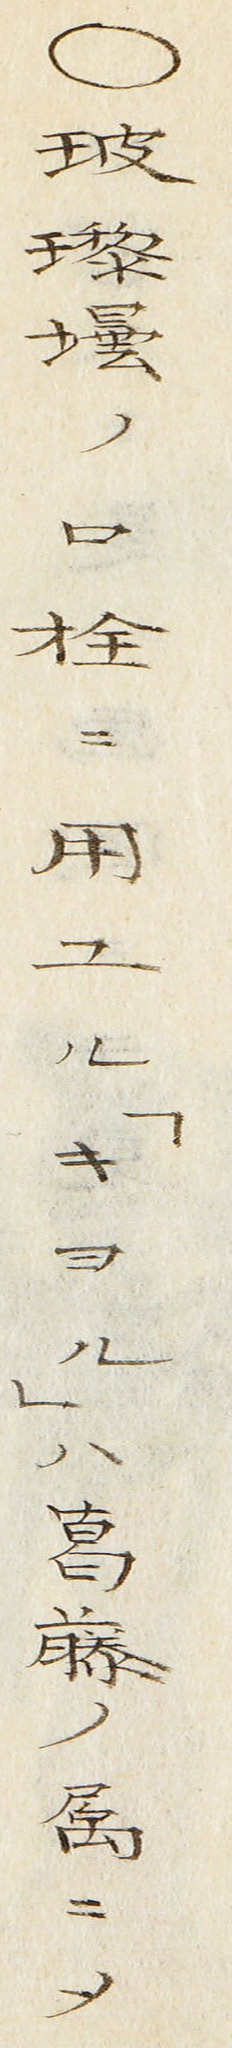〇玻瓈壜ノ口栓ニ用ユル「キヨル」ハ葛藤ノ属ニシテ
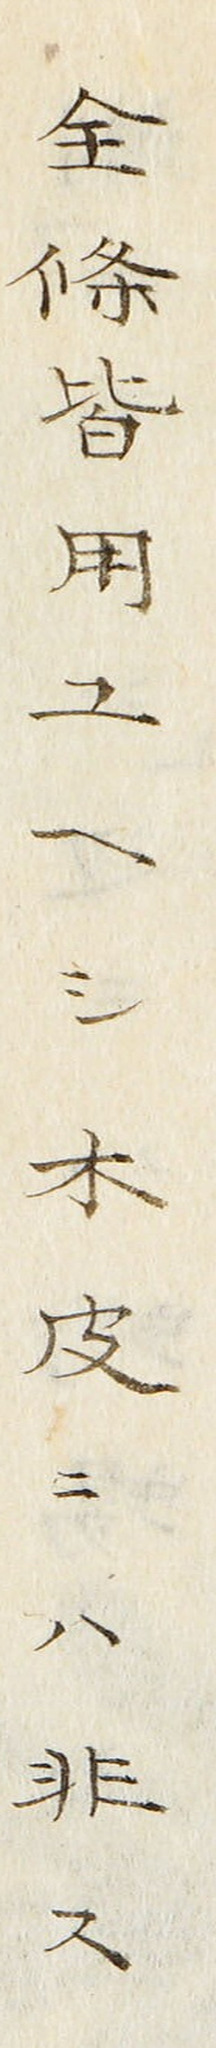全條皆用ユヘシ木皮ニハ非ス
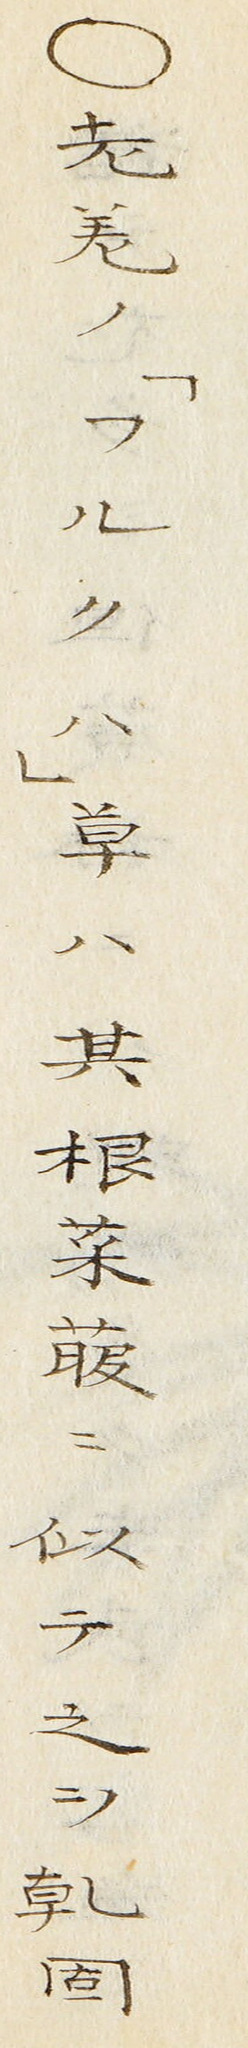〇老羗？ノ「ワルクハ」草ハ其根菜菔ニ似テ之ヲ乾固
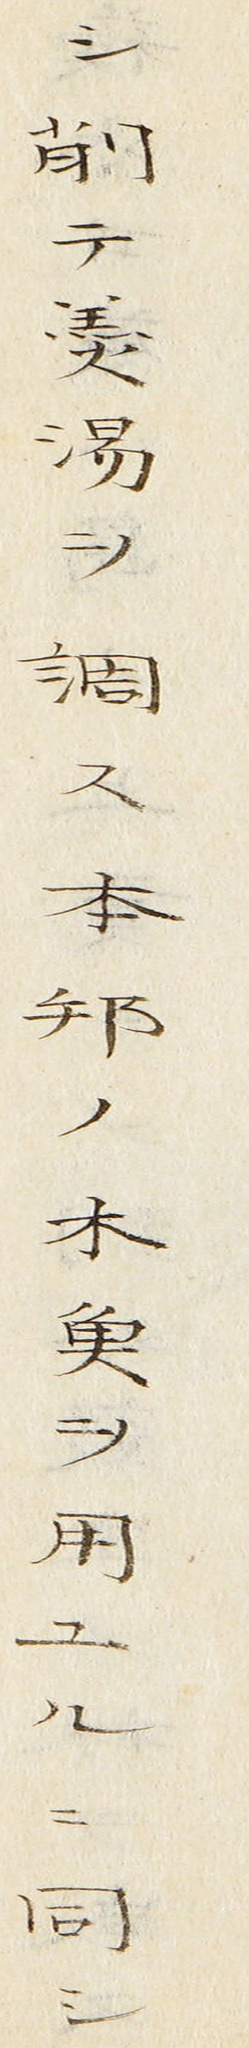シ削テ羮？湯ヲ調ス本邦ノ木魚ヲ用ユルニ同シ
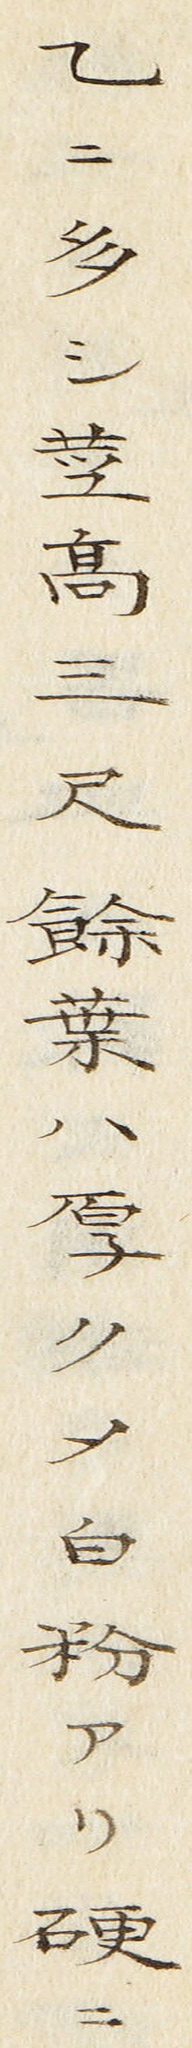乙ニ多シ茎？高三尺余葉ハ厚クシテ白粉アリ硬ニ
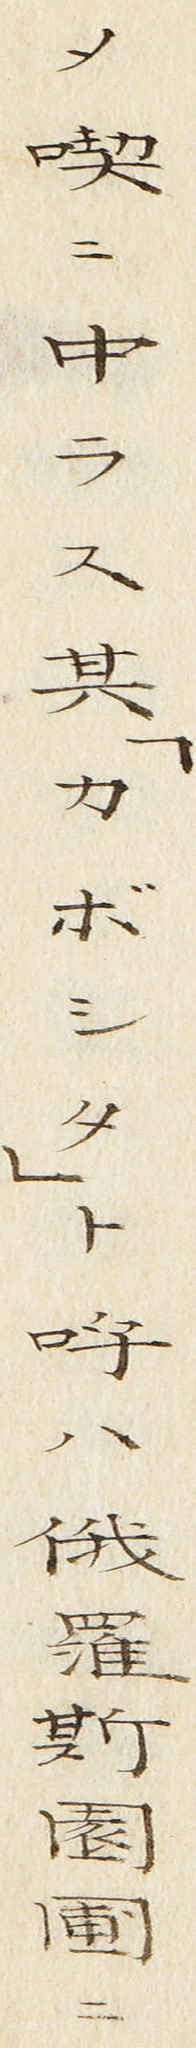シテ喫ニ中ラス其「カボシタ」ト呼ハ俄羅斯園圃ニ
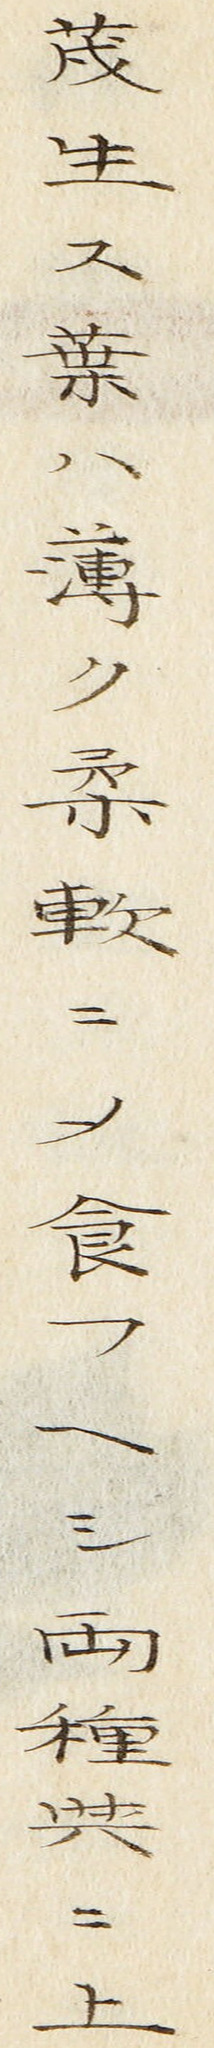茂生ス葉ハ薄ク柔軟ニシテ食フヘシ両種共？ニ上
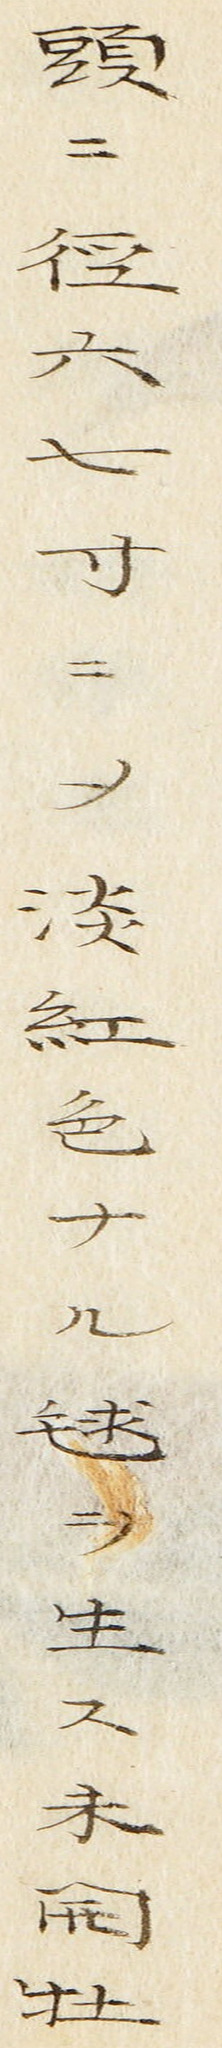頭ニ径六七寸ニシテ淡紅色ナル毬ヲ生ス未開牡湍
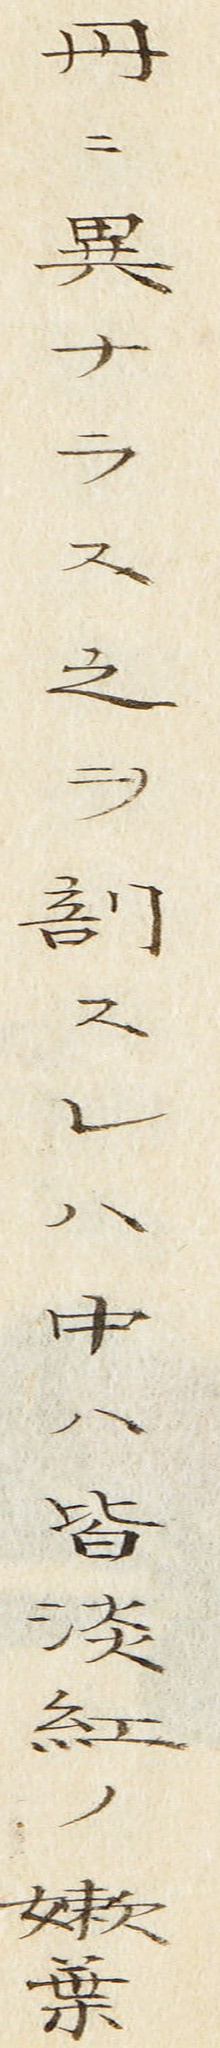丹ニ異ナラス之ヲ剖スレハ中ハ皆淡紅ノ嬾葉
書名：蕃談
